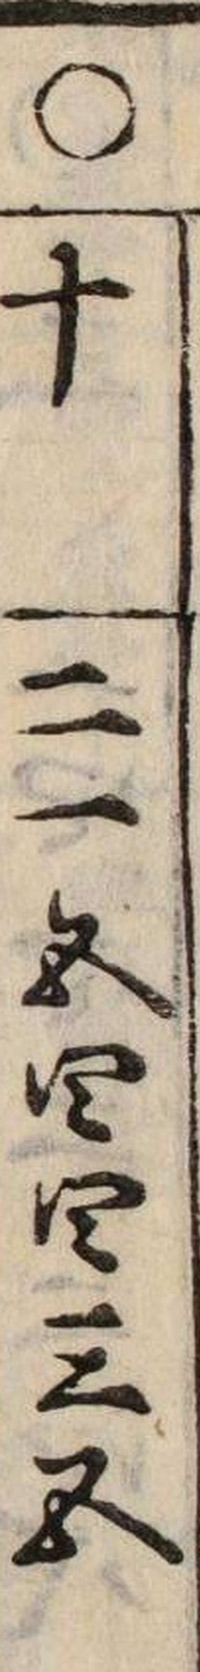○十二一五四四三五
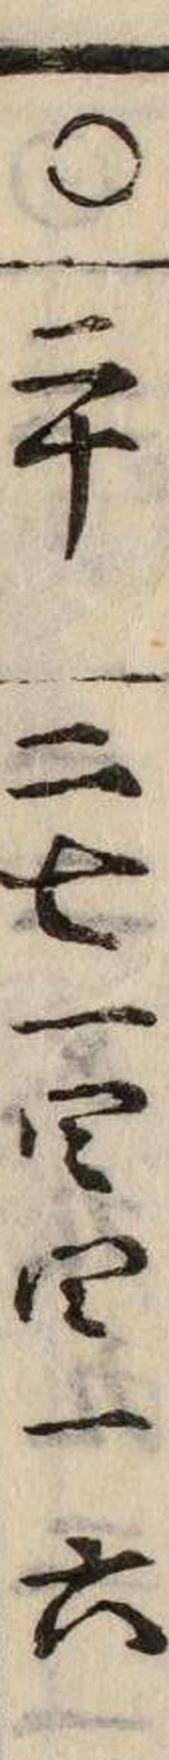○二十二七一四四一六
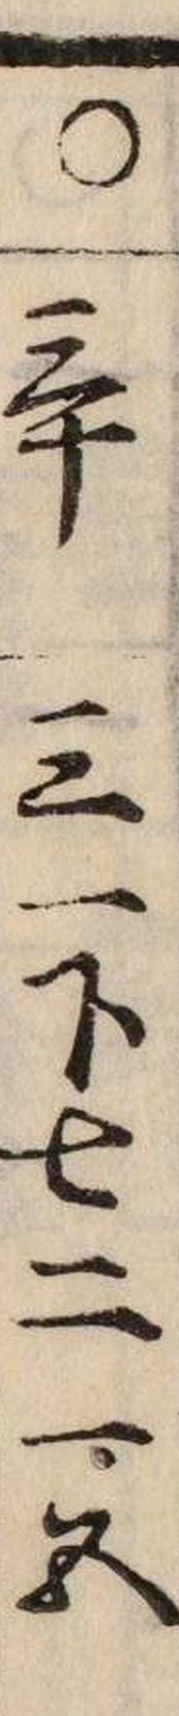○三十三一下七二一五
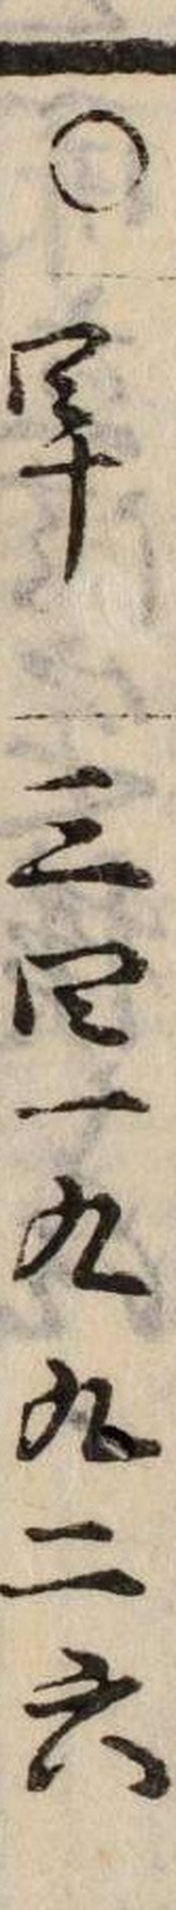○四十三四一九九二六
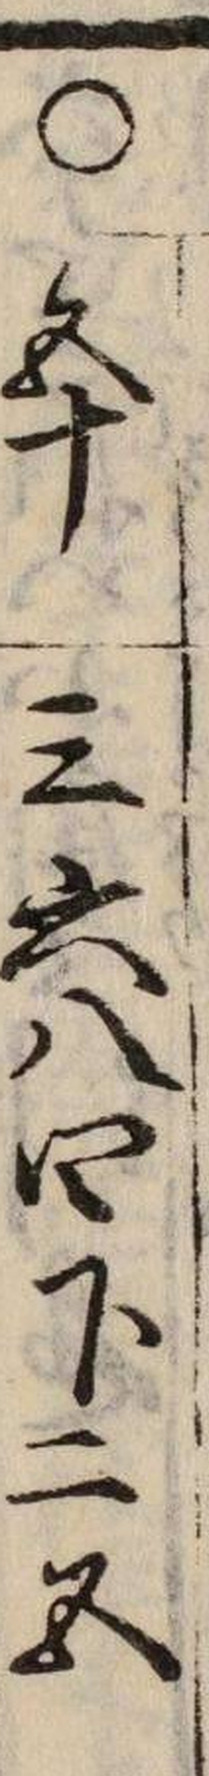○五十三六八四下二五
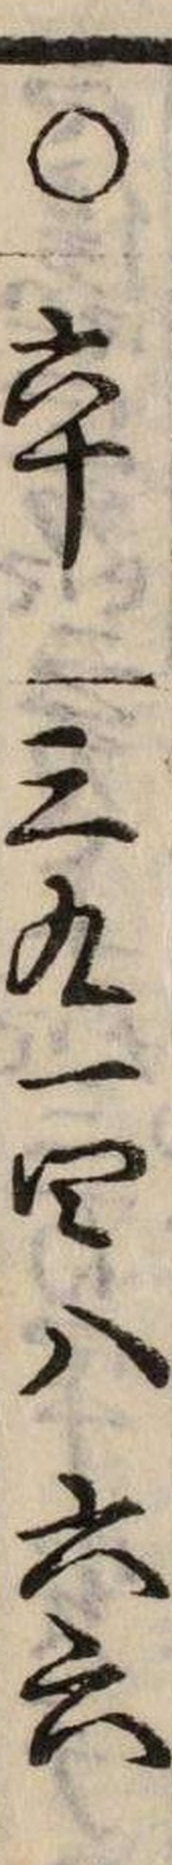○六十三九一四八六六
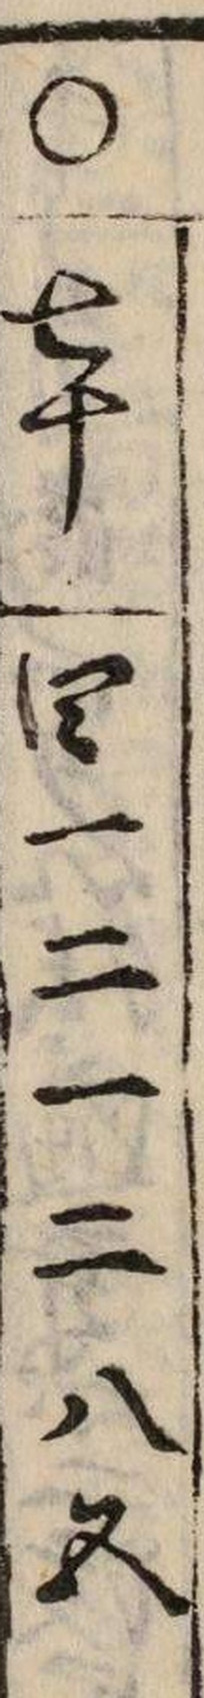○七十四一二一二八五
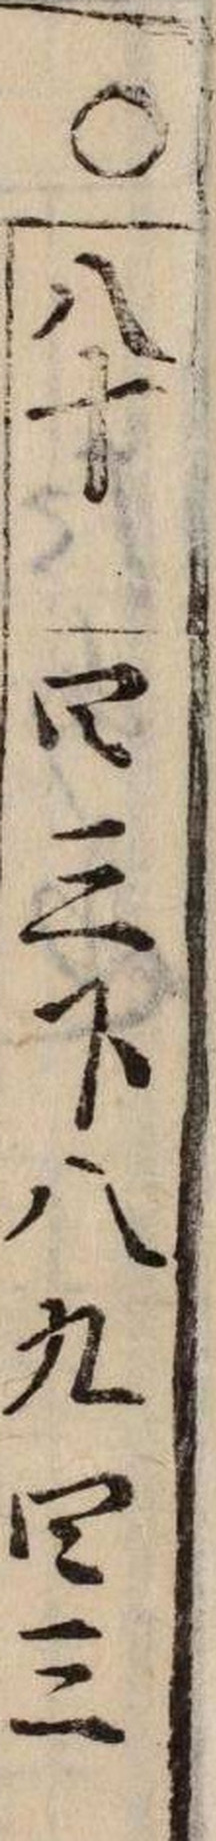○八十四三下八九四三
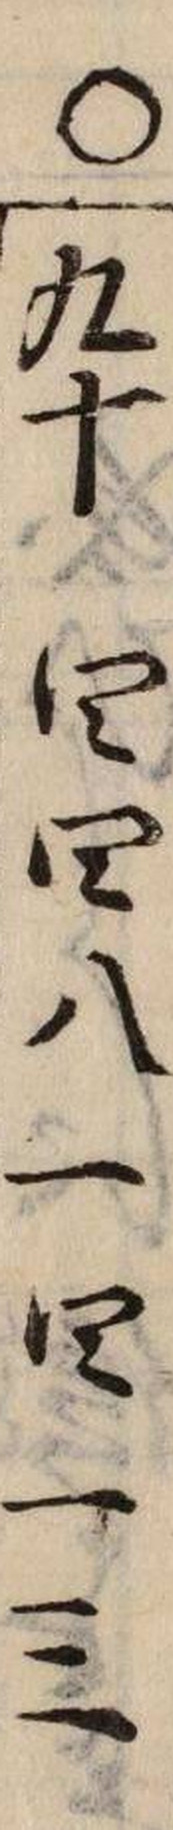○九十四四八一四一三
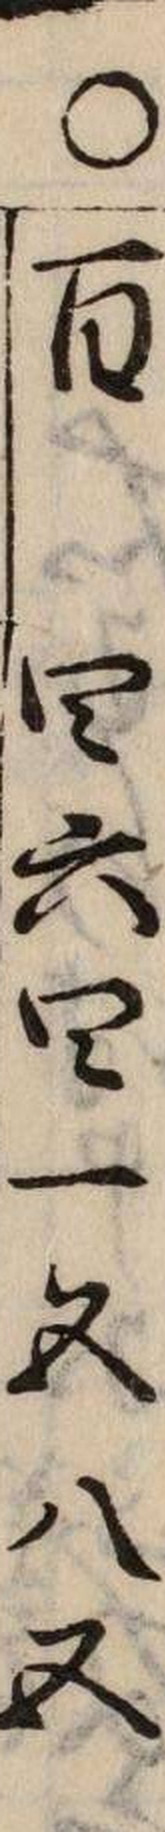○百四六四一五八五
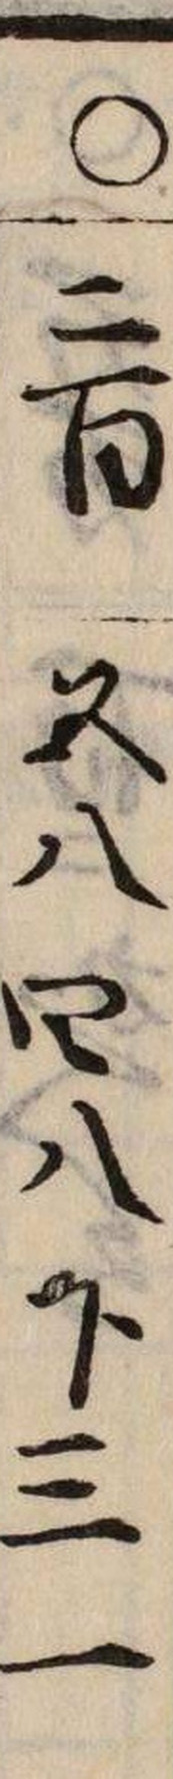○二百五八四八下三一
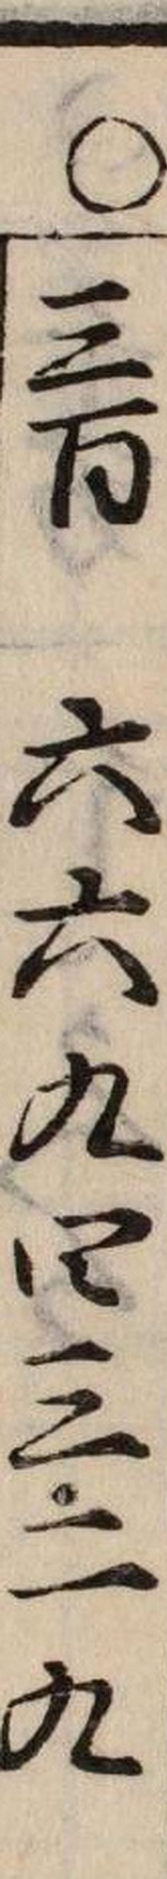○三百六六九四三二九
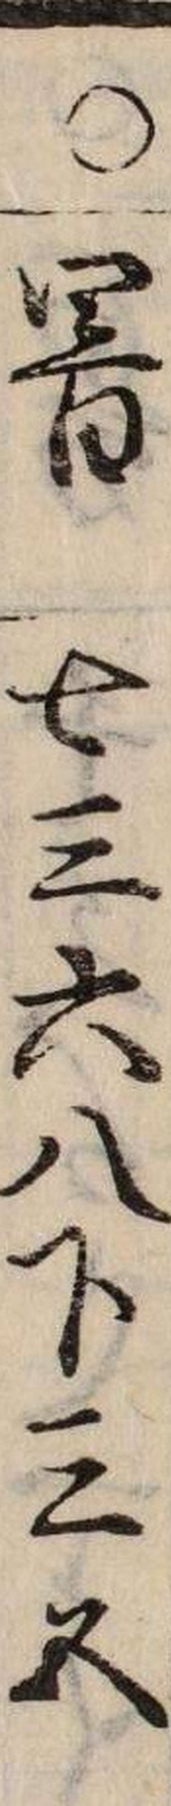○四百七三六八下三五
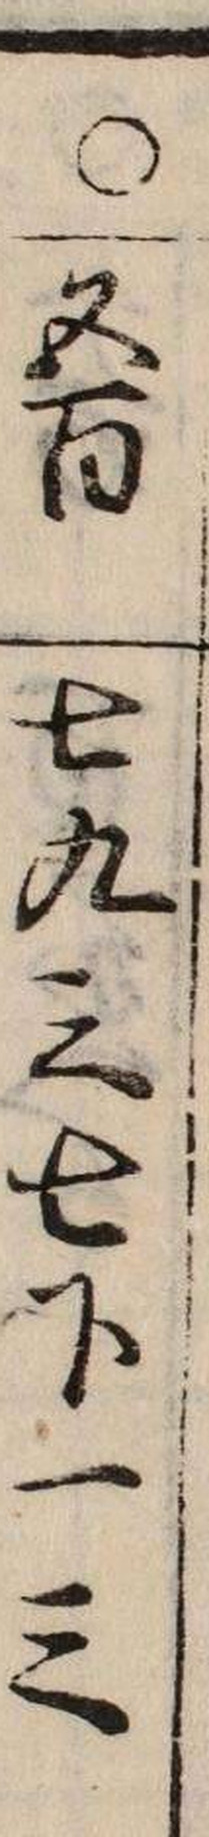○五百七九三七下一三
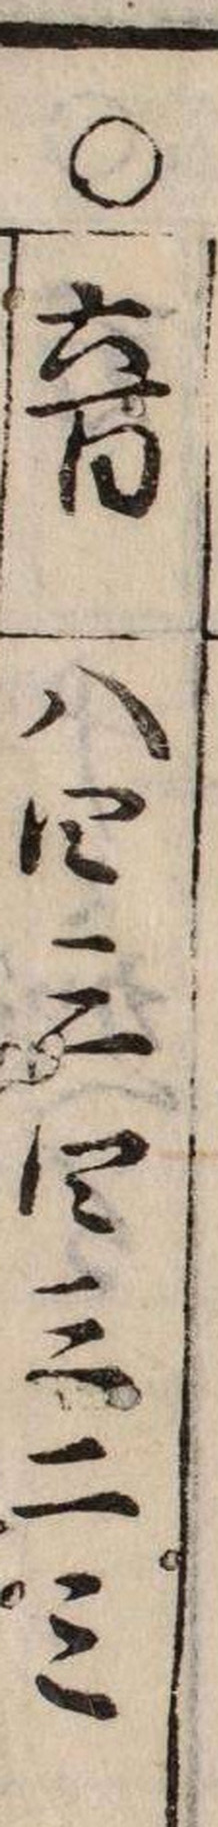○六百八四三四三二三
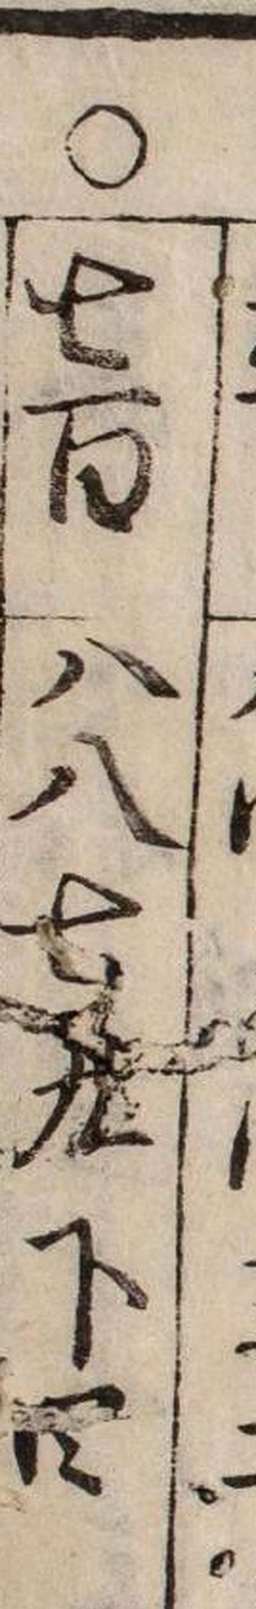○七百八八七九下四
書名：塵劫記（寛永11年自跋、京都府立京都学・歴彩館追貴8）
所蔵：京都府立京都学・歴彩館 国文学研究資料館
